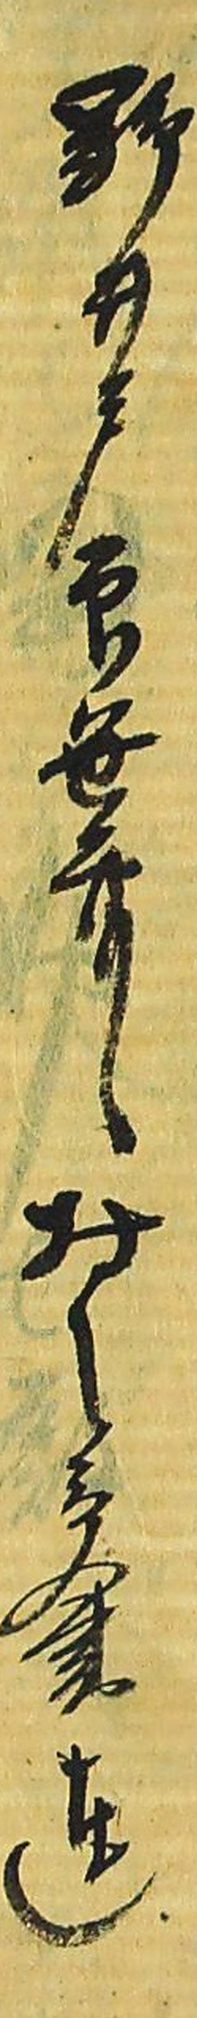野井戸印笹竹之村々受書達
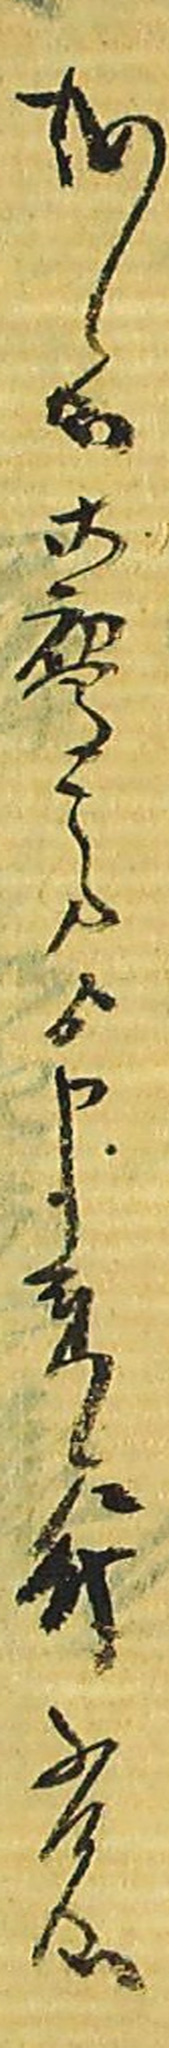之義御鷹方ゟ申達候に付右儀
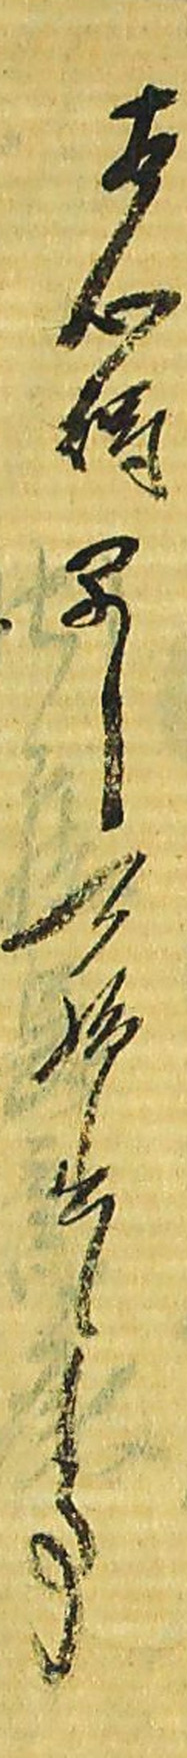相心得早々可指出候事

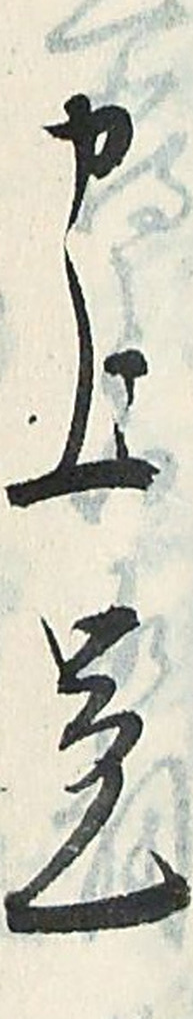申上覚
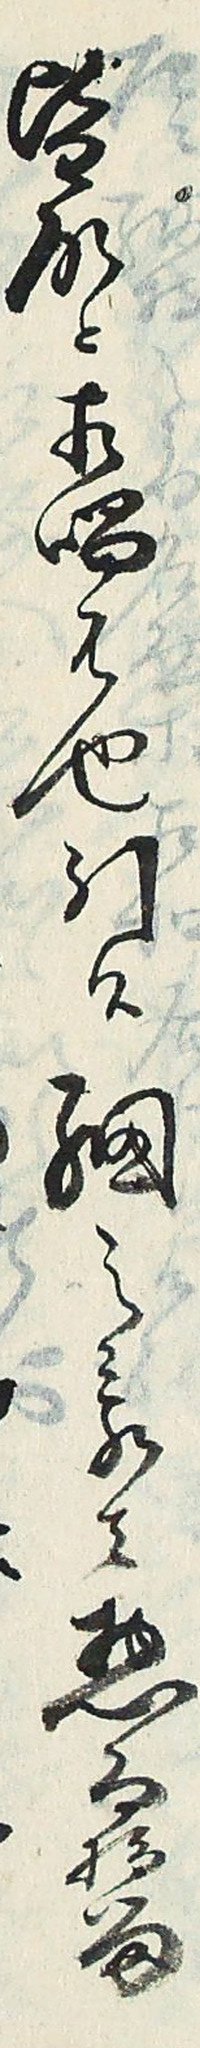皆取と相唱はせ引候網之義は惣而指留
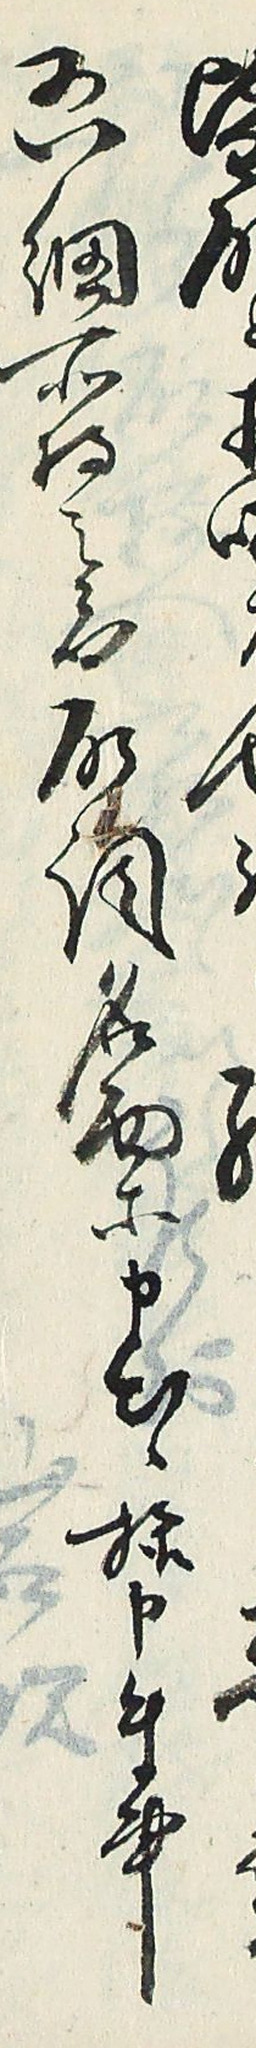右網所持之者取調名西等申出候様申付事
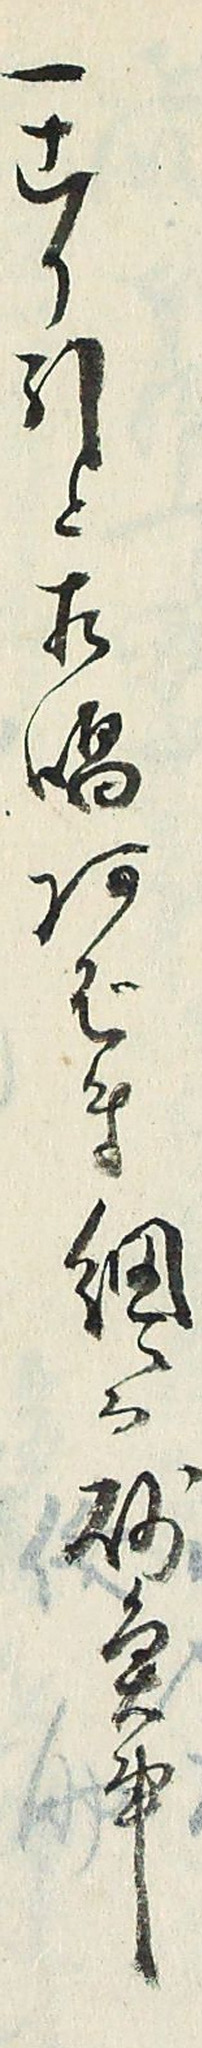一こり引と相唱あば付網に而砂魚事
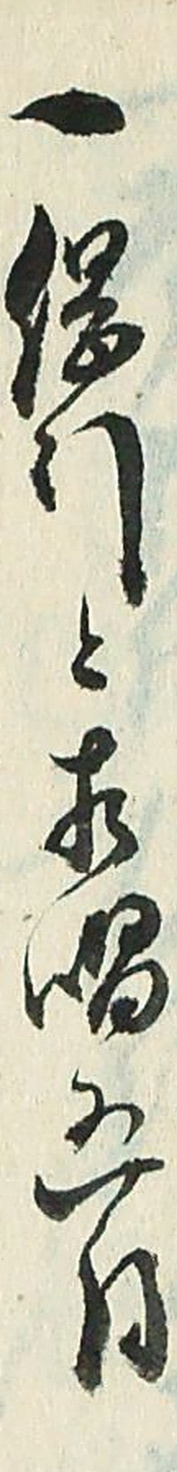一綱引と相唱右同
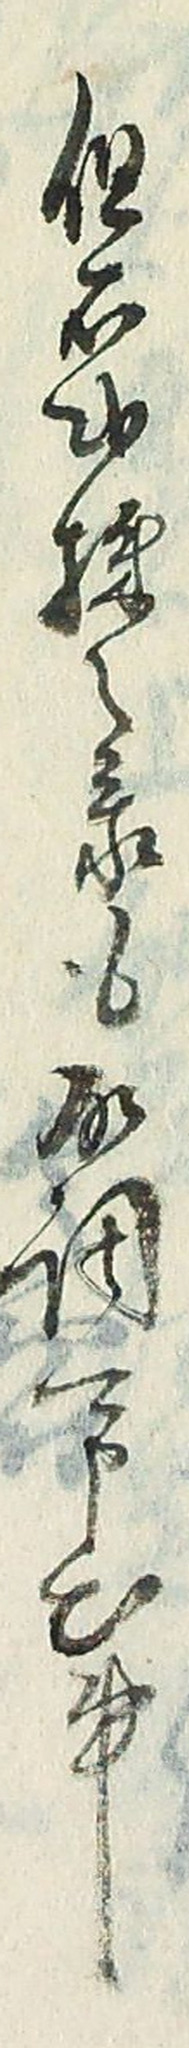但右弐株之義も取調可申出事
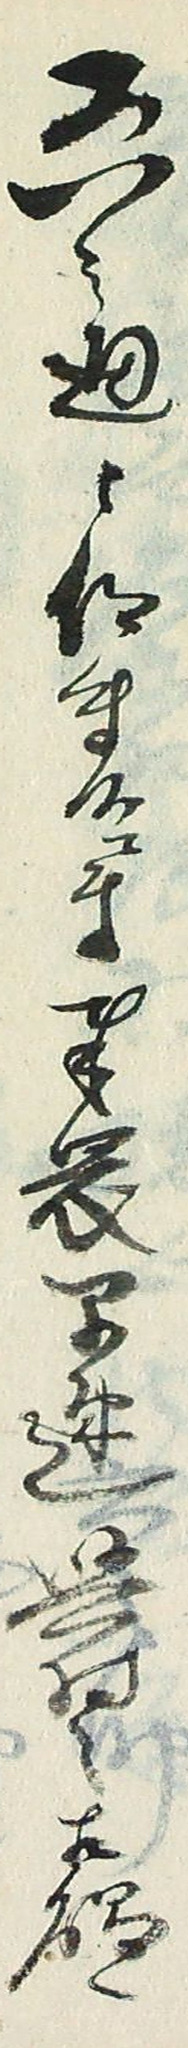右之通被仰付候に付奉畏早速与村々相触候
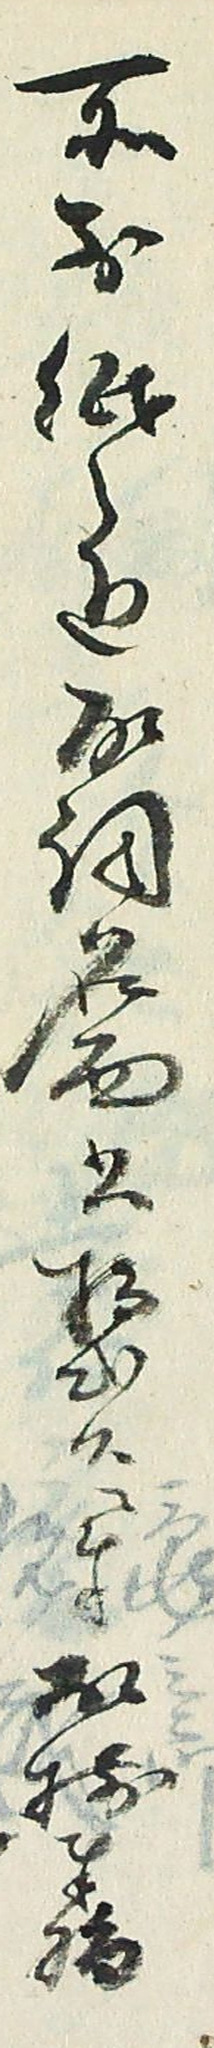所別紙之通取調名面書指出候に付取揃奉指
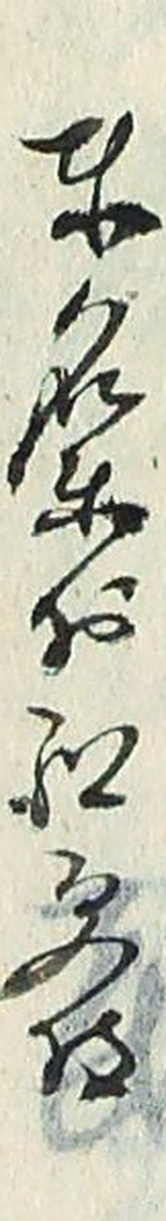東名東村組受持
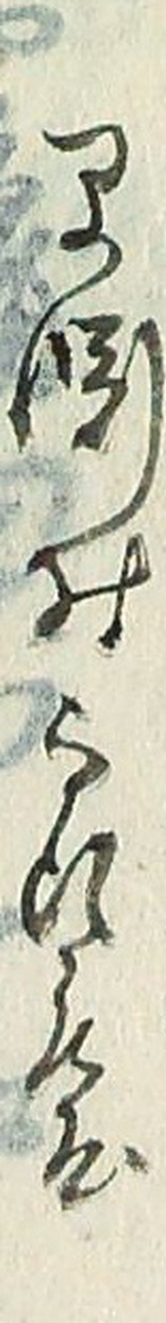早渕村与頭庄屋
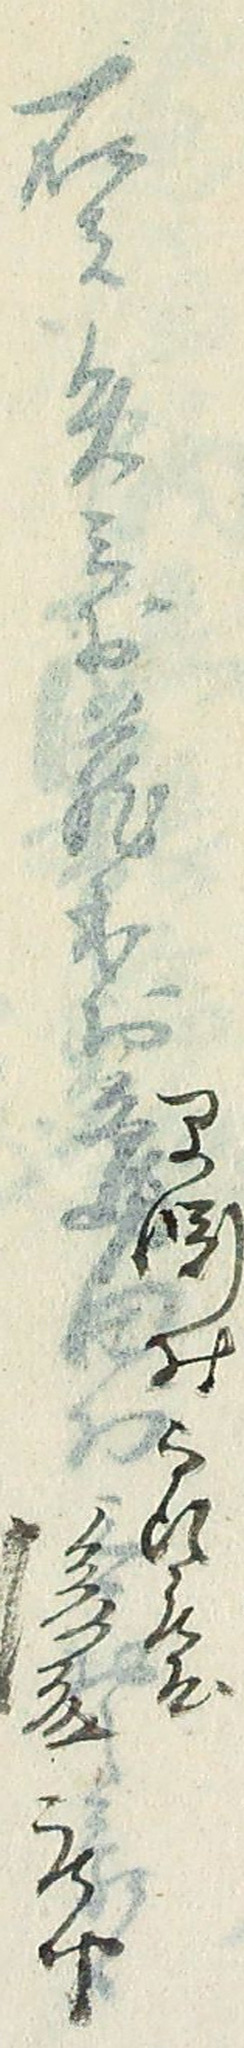後藤庄助
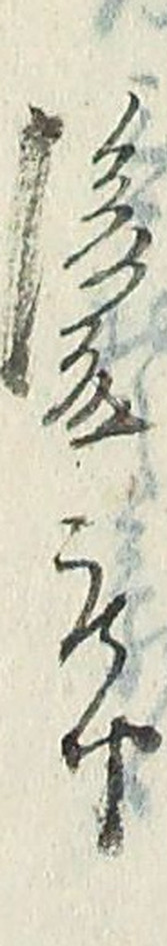後藤庄助
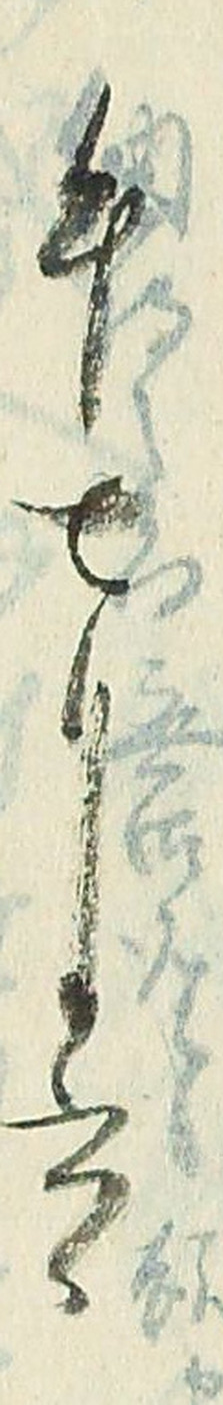午七月六日
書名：諸御用御□受書控
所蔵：鳴門教育大学 Naruto University of Education
